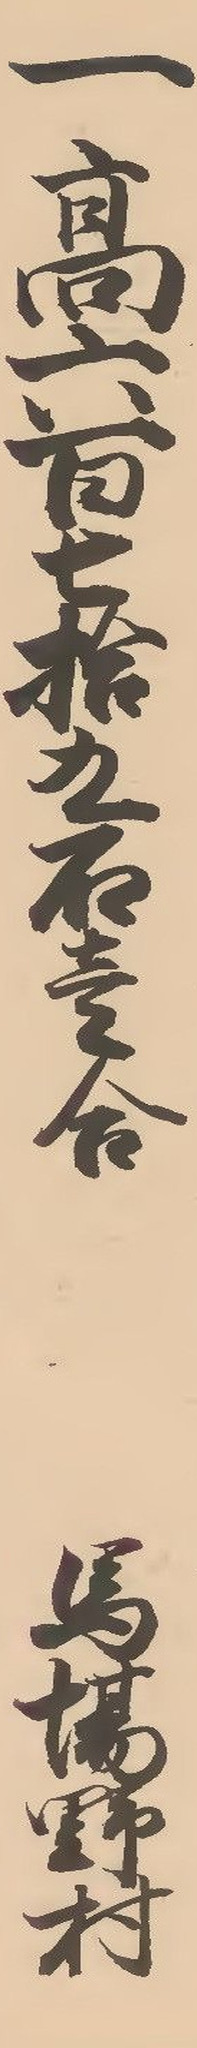一高六百七拾九石壱合馬場野村
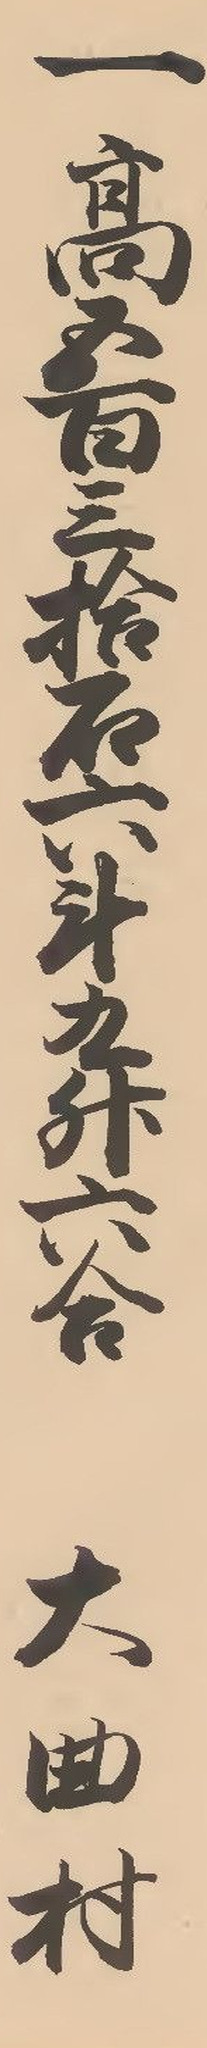一高五百三拾石六斗九升六合大曲村
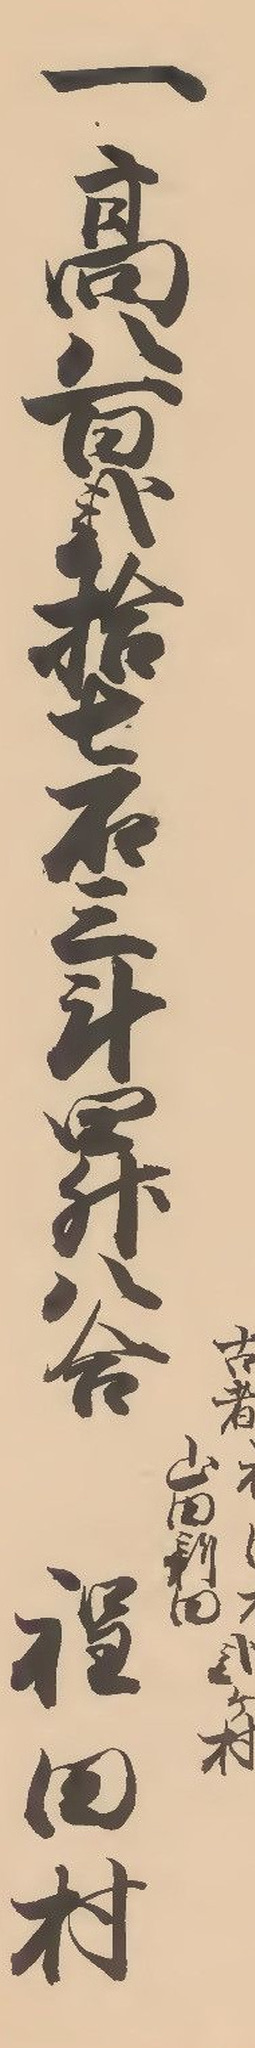一高八百弐拾七石三斗四升八合程田村
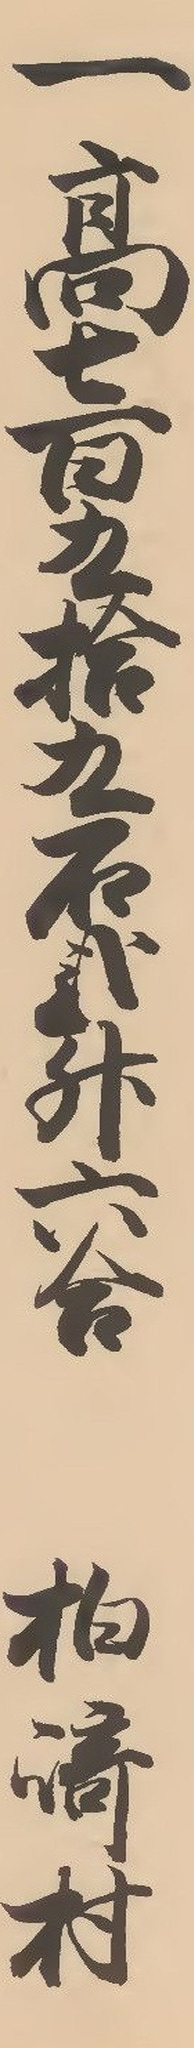一高七百九拾九石弐升六合柏崎村
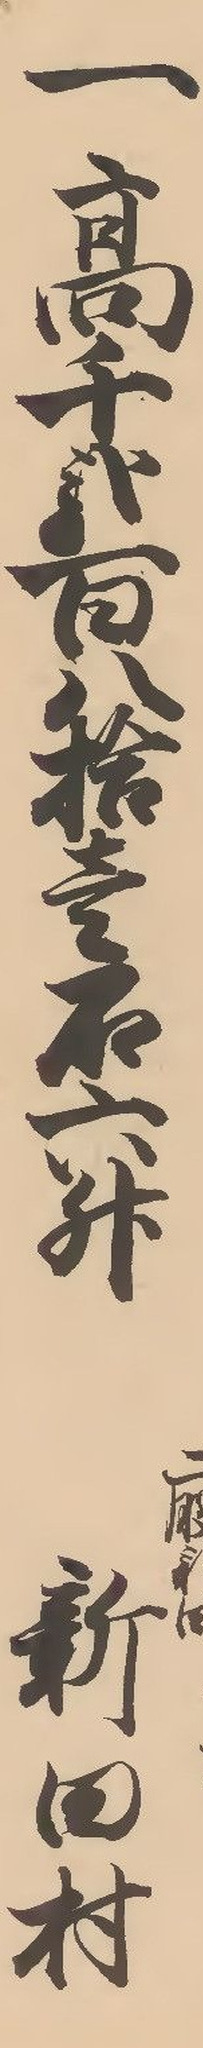一高千弐百八拾壱石六升新田村

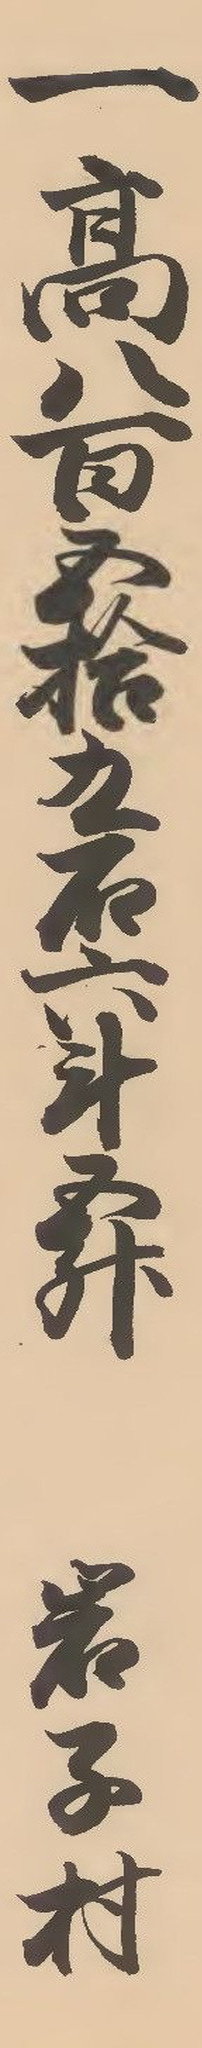一高八百五拾九石六斗五升岩子村
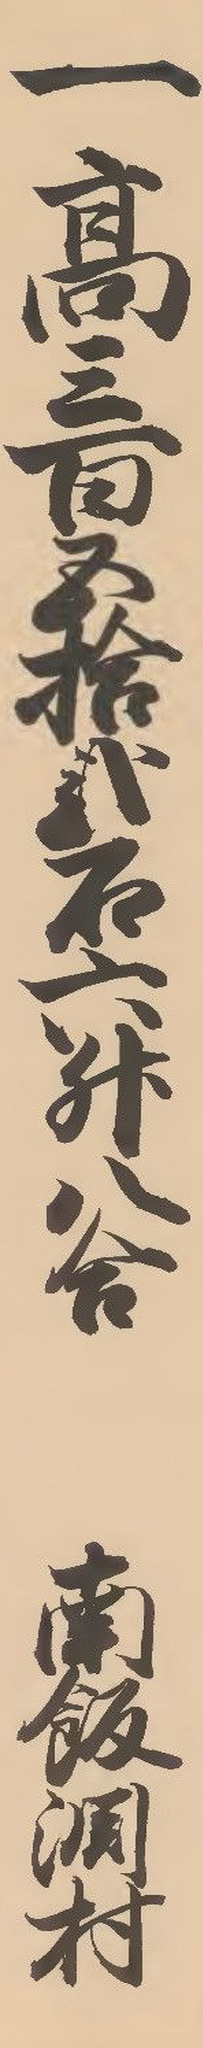一高三百五拾弐石六升八合南飯淵村
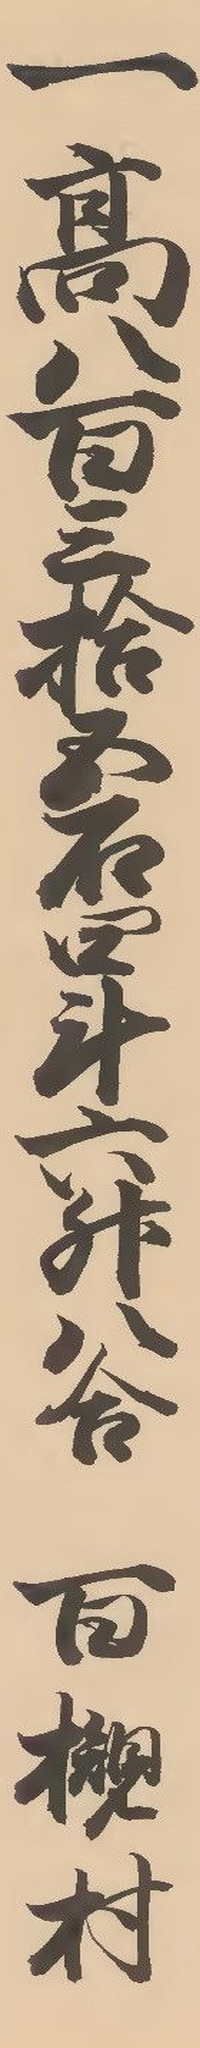一高八百三拾五石四斗六升八合百槻村
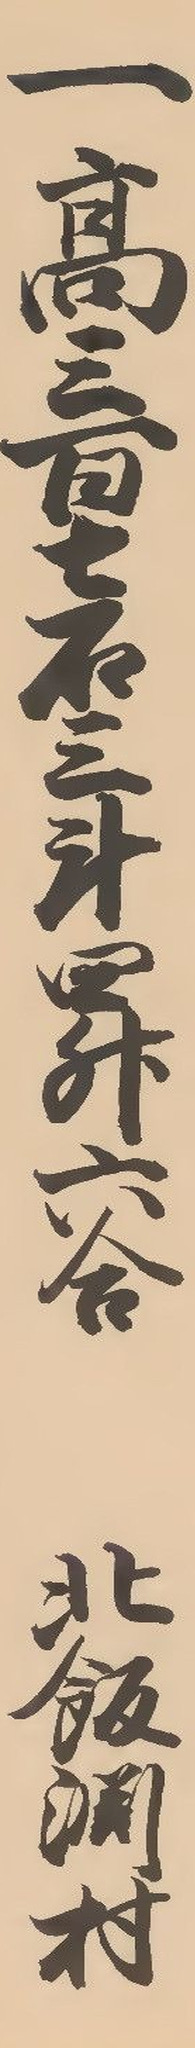一高三百七石三斗四升六合北飯淵村
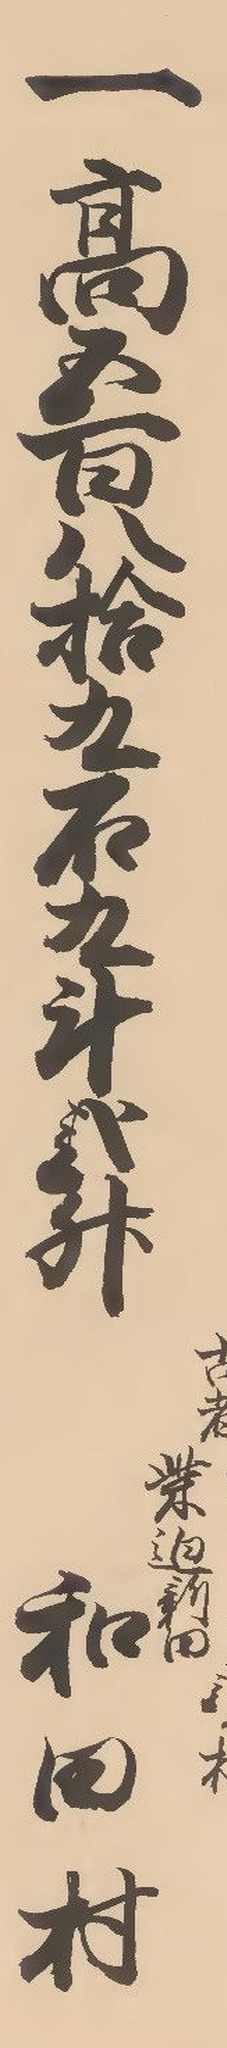一高五百八拾九石九斗弐升和田村
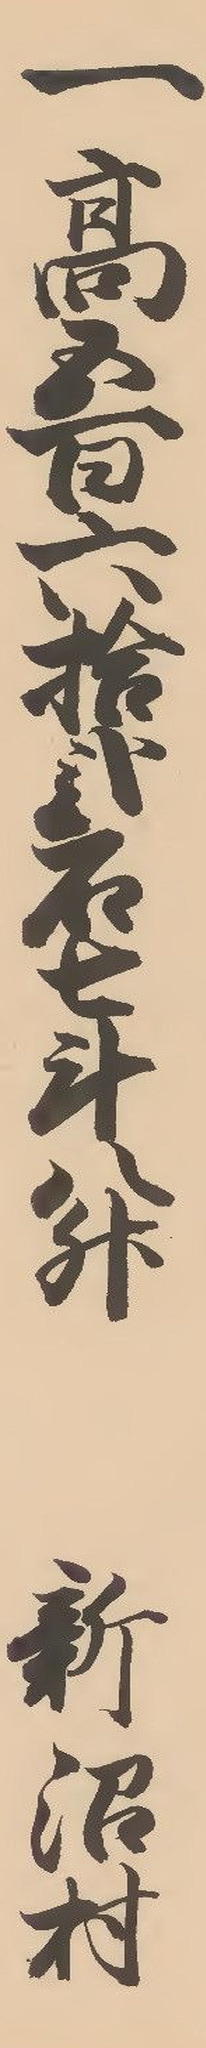一高五百六拾弐石七斗八升新沼村
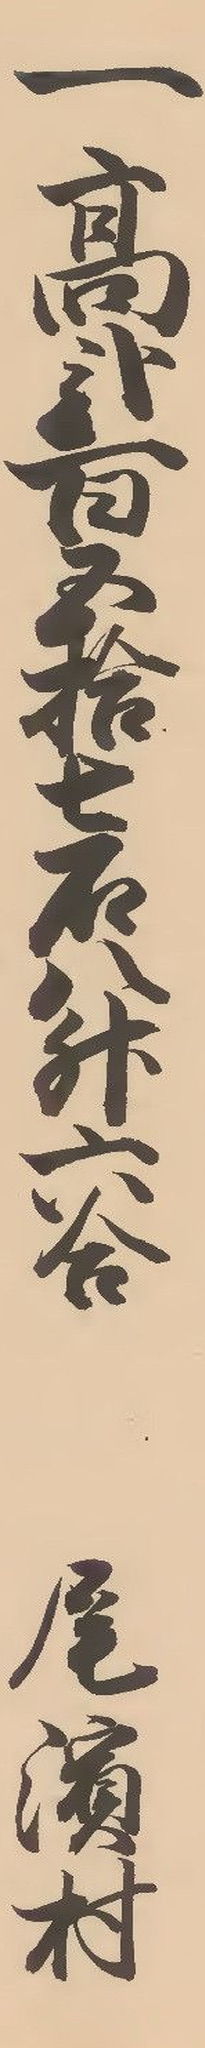一高弐百五拾七石八升六合尾浜村
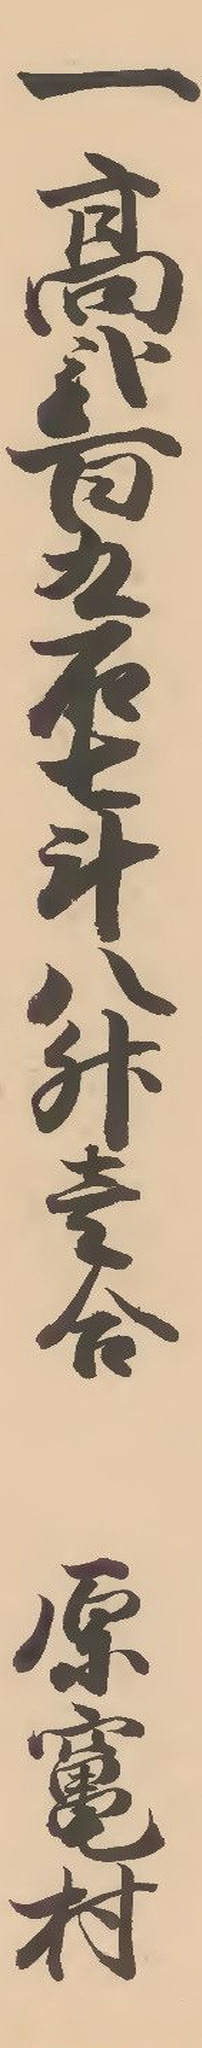一高弐百九石七斗八升壱合原竃村

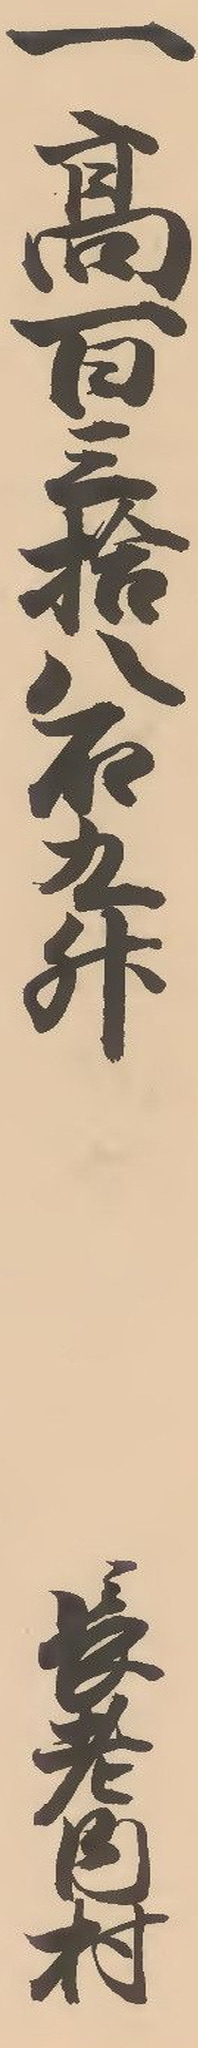一高百三拾八石九升長老内村
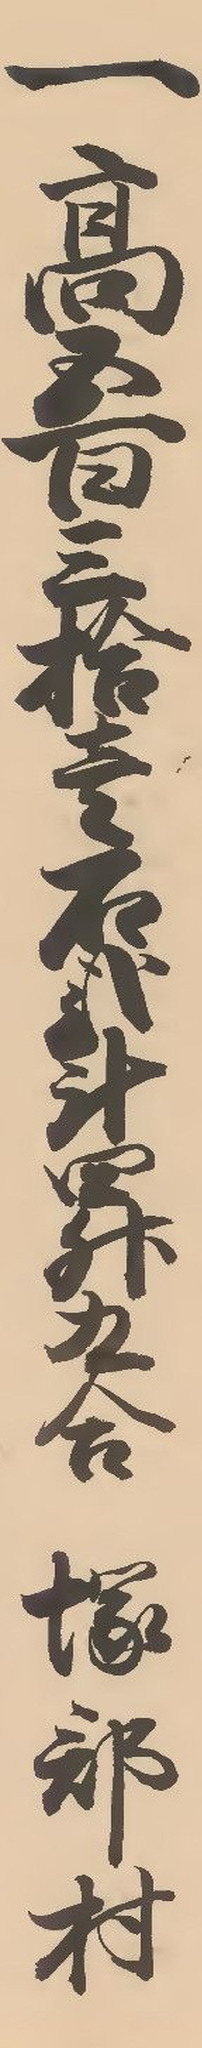一高五百三拾壱石弐斗四升九合塚部村
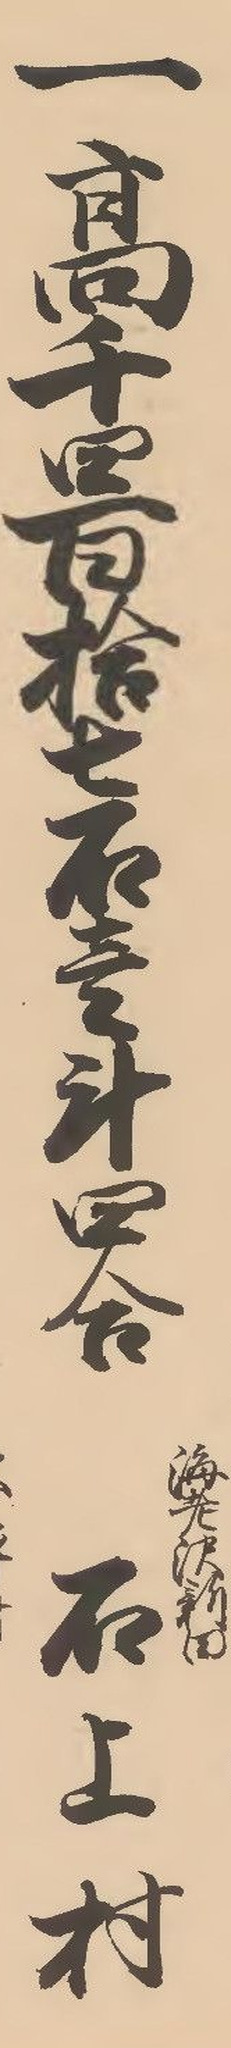一高千四百拾七石壱斗四合石上村
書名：陸奥国郷帳　３
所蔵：国立公文書館 National Archives of Japan
